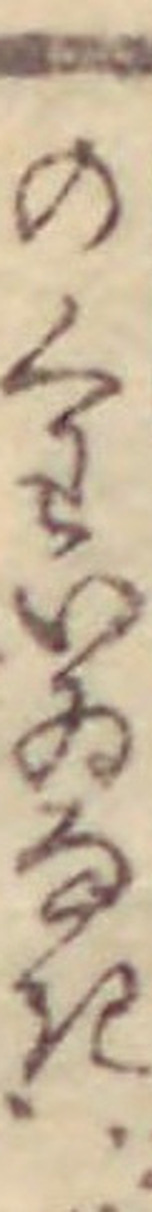のくわいゐなき
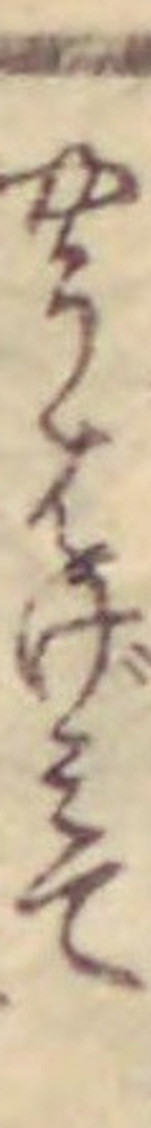やうはげみて
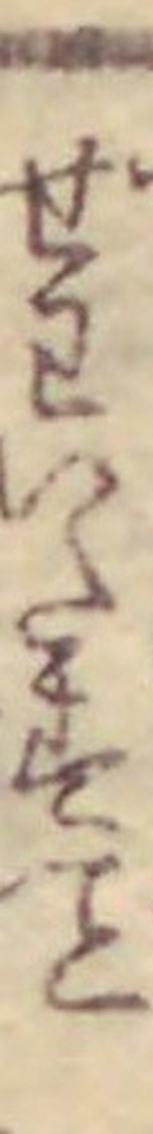せわいたすこと
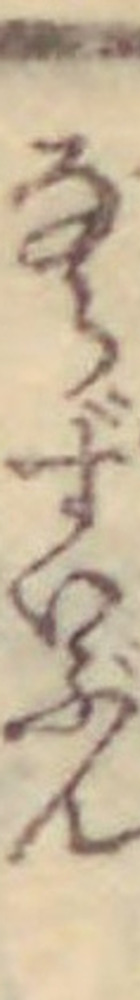ならずいぶん
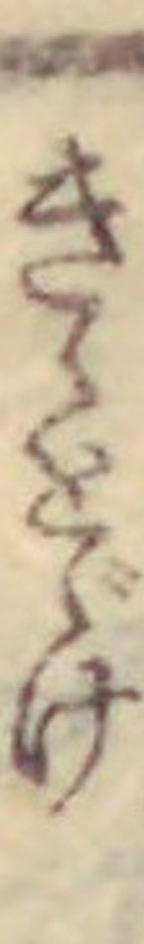きゝとゞけ
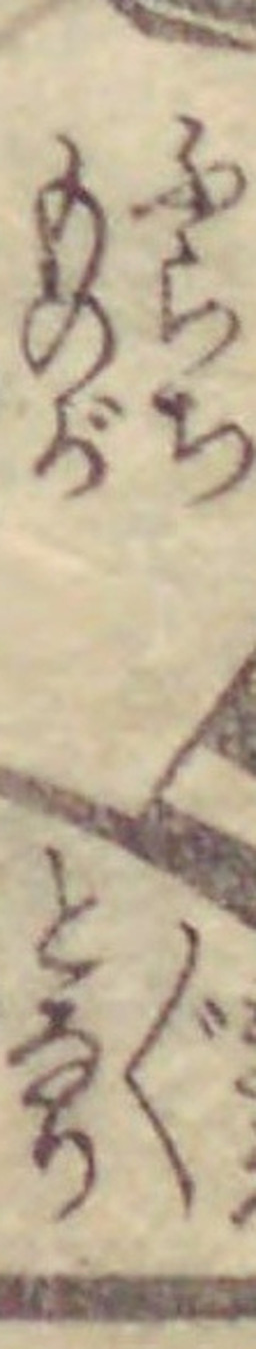ものが
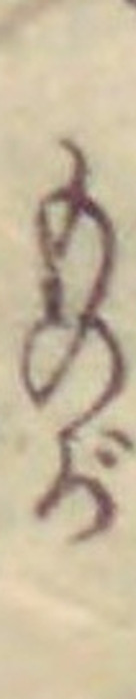ものが
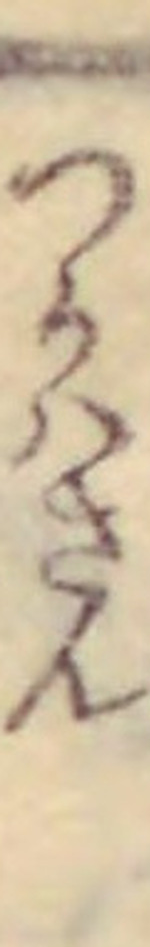つかはさん
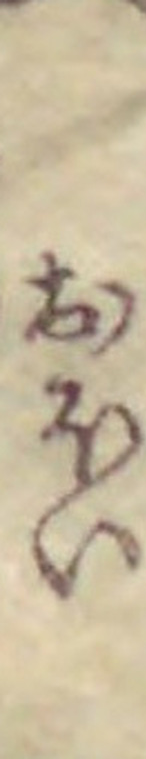おほい
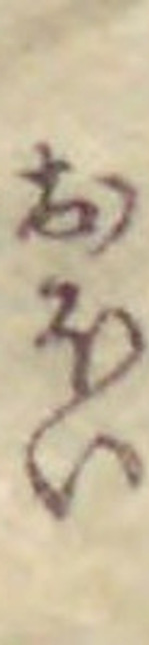おほい
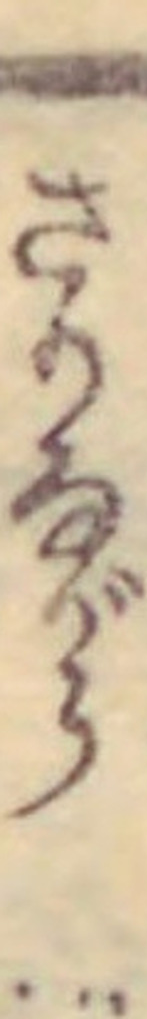さりながら
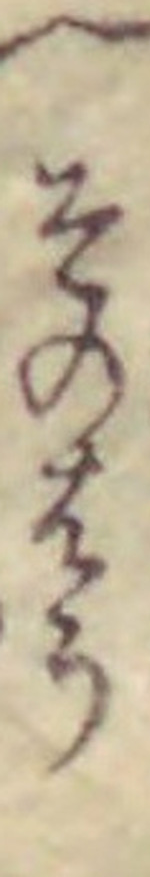そのはう
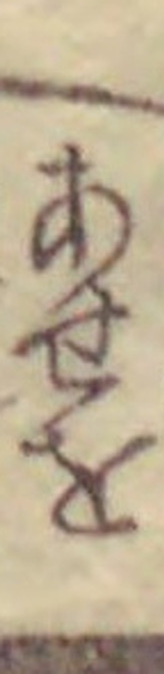あせを
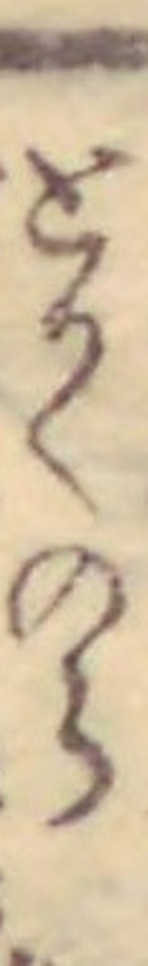とかくのら
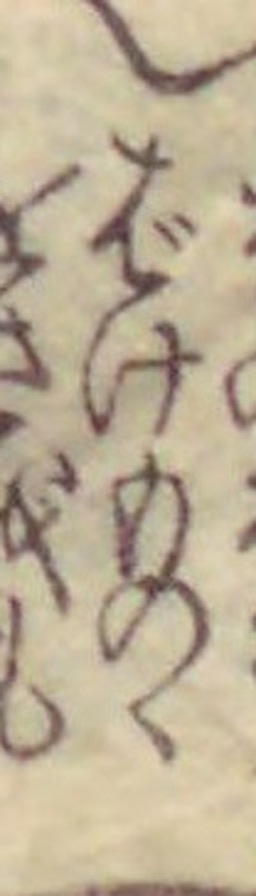をさをも
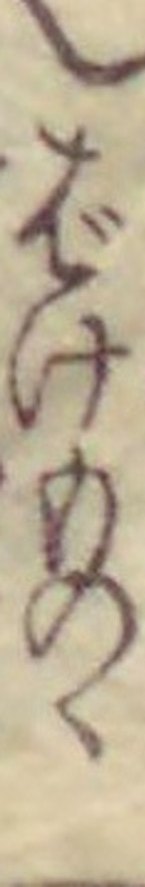ばけものゝ
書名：化物世帯氣質
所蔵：国立国会図書館 National Diet Library, JAPAN
